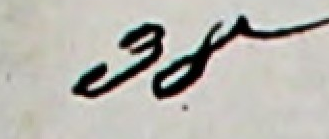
38
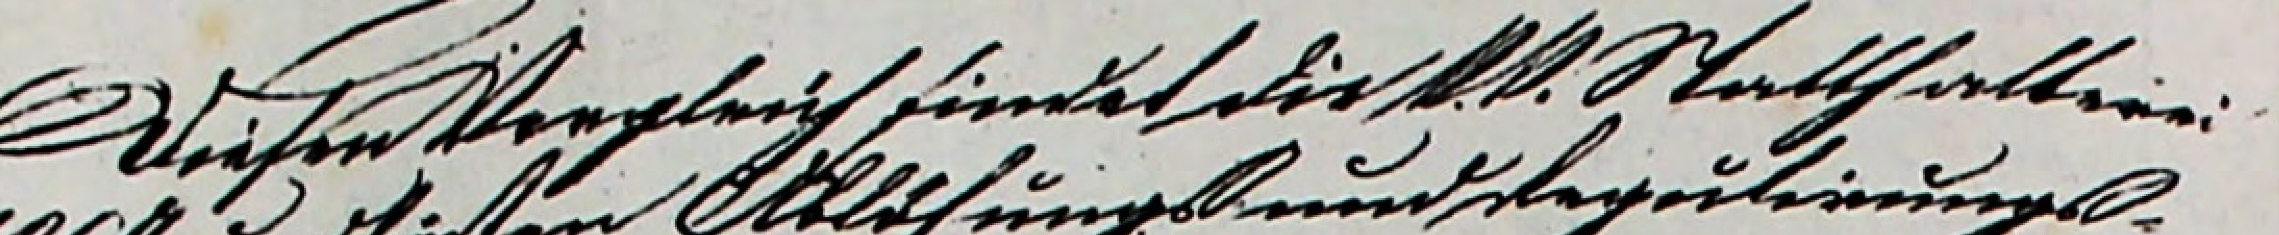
Diesen Vergleich findet die k.k. Statthalterei
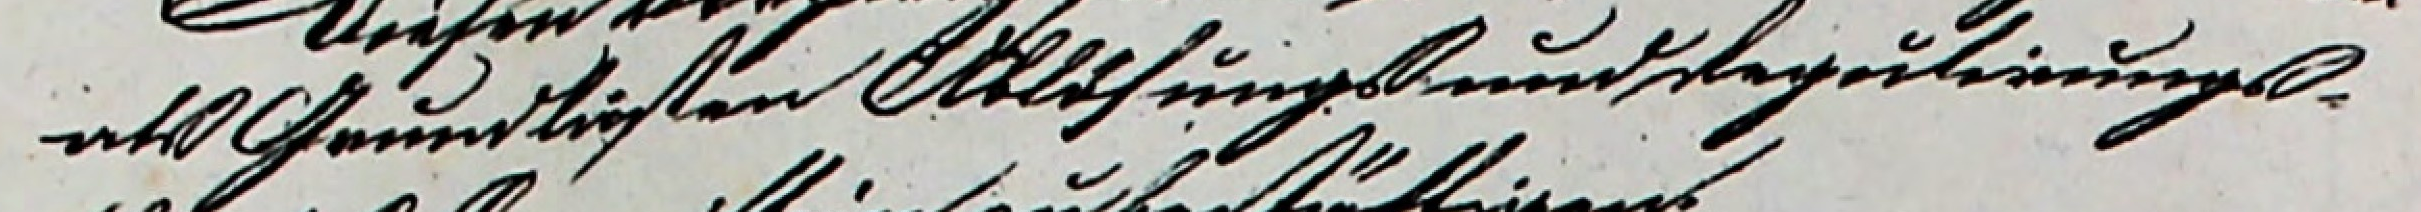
als Grundlasten Ablösung und Regulirungs=
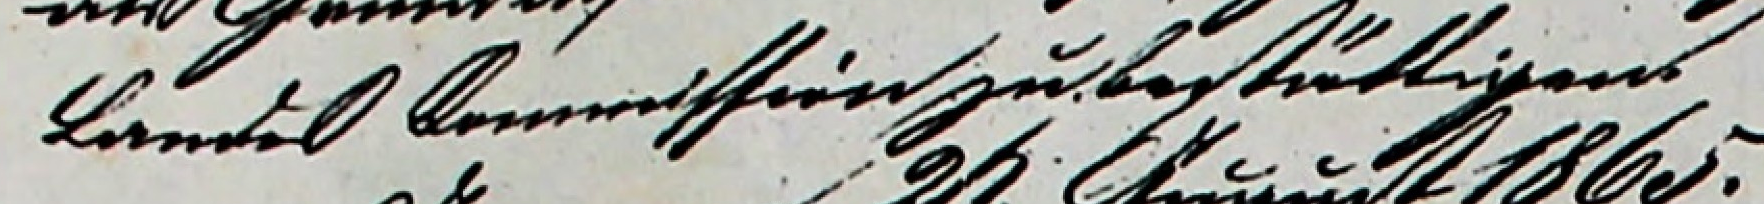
Landes Kommission zu bestättigen
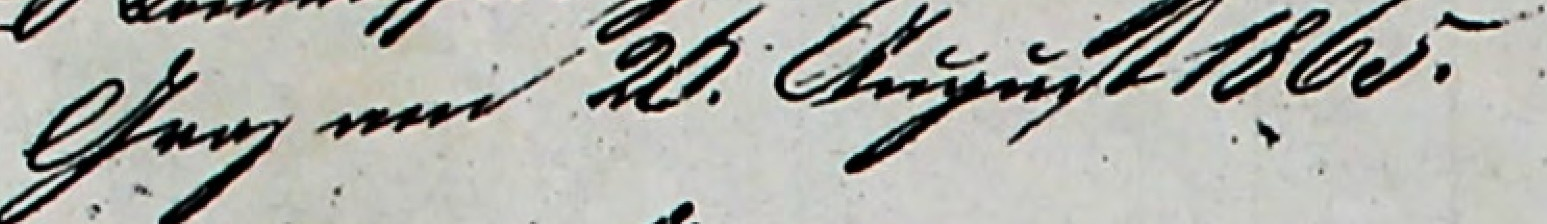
Graz am 26. August 1865.
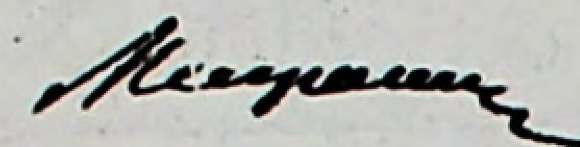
M???
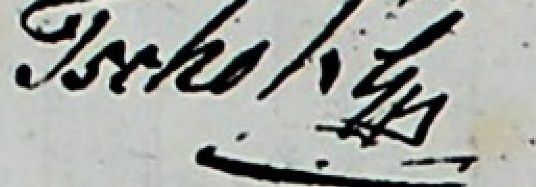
Tschsh???
